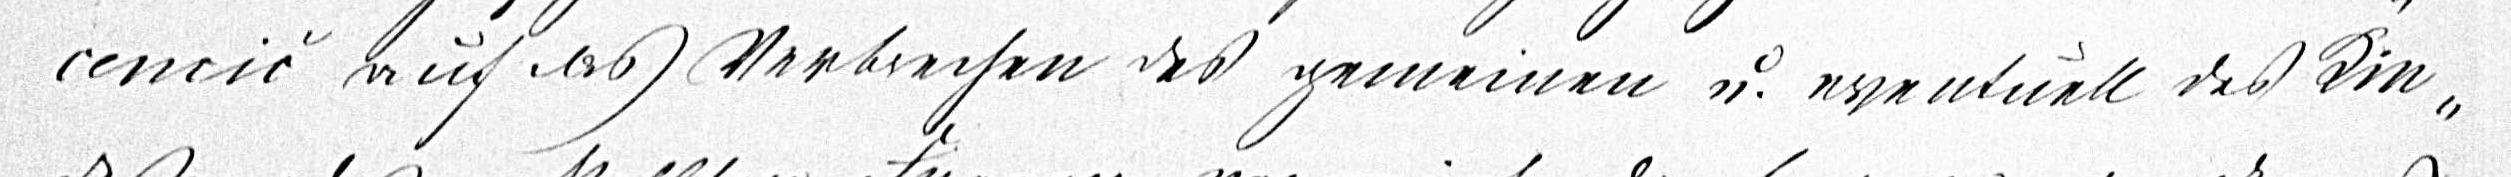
cenič auf das Verbrechen des gemeinen u. eventuell das Kin¬
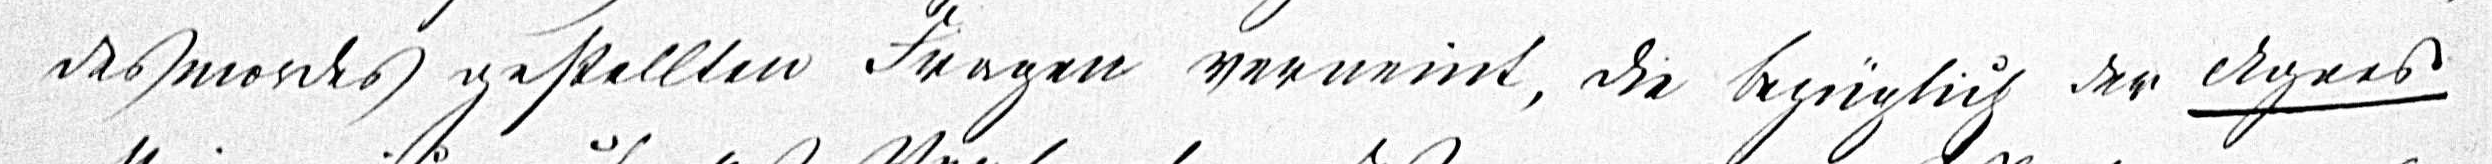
desmordes gestellten Fragen verneint, die bezüglich der Agnes
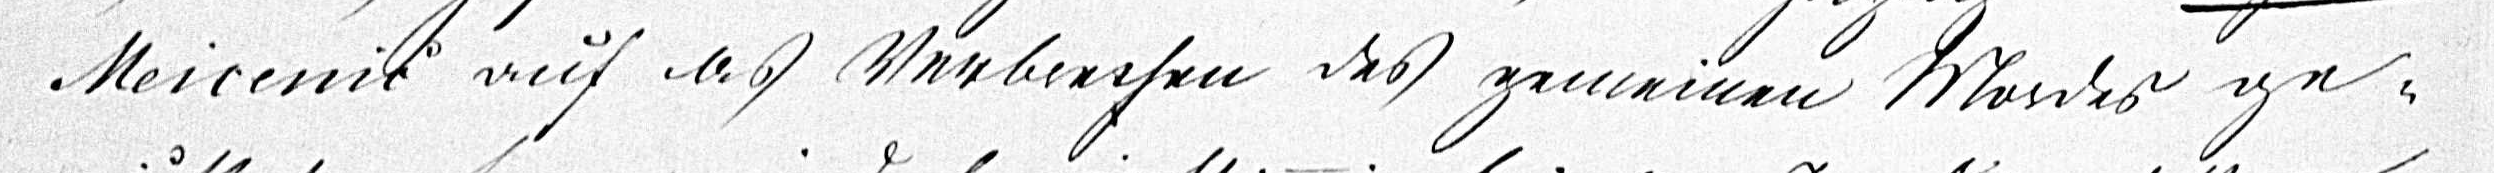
Meicenič auch das Verbrechen des gemeinen Mordes ge¬
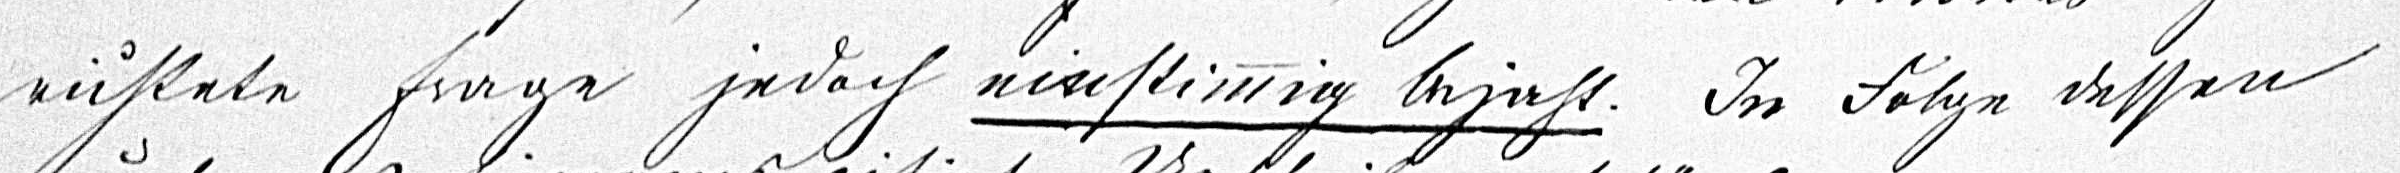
richtete Frage jedoch einstimmig bejaht. In Folge dessen
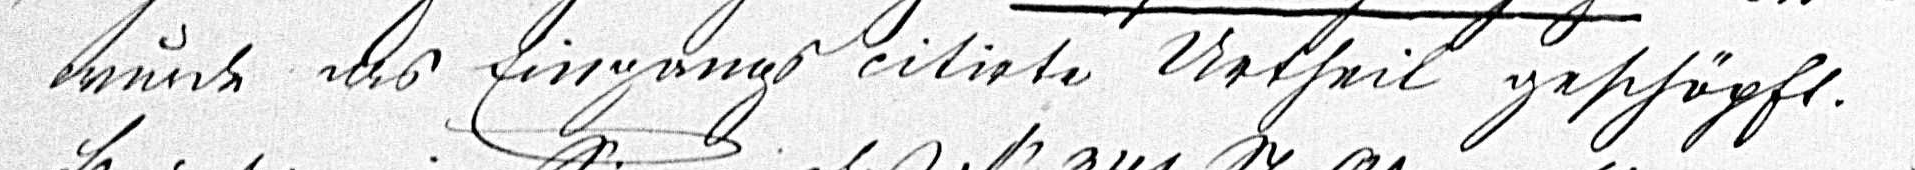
wurde das Eingangs citirte Urtheil geschöpft.
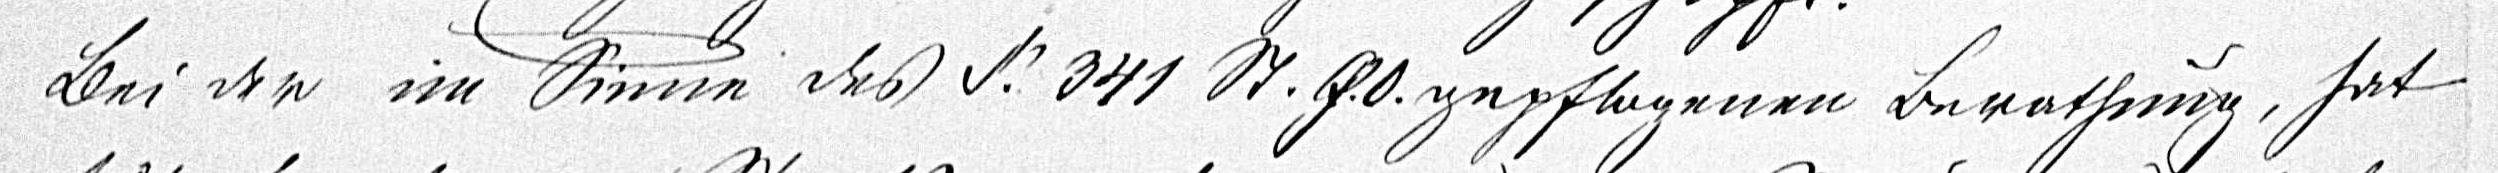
Bei der im Sinne des §341 St G O gepflogenen Berathung, hat
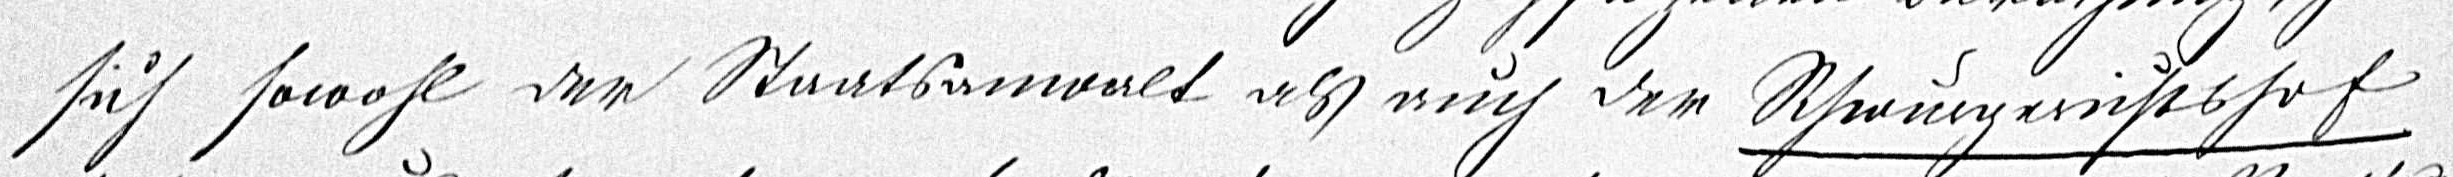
sich sowohl der Staatsanwalt als auch der Schwurgerichtshof
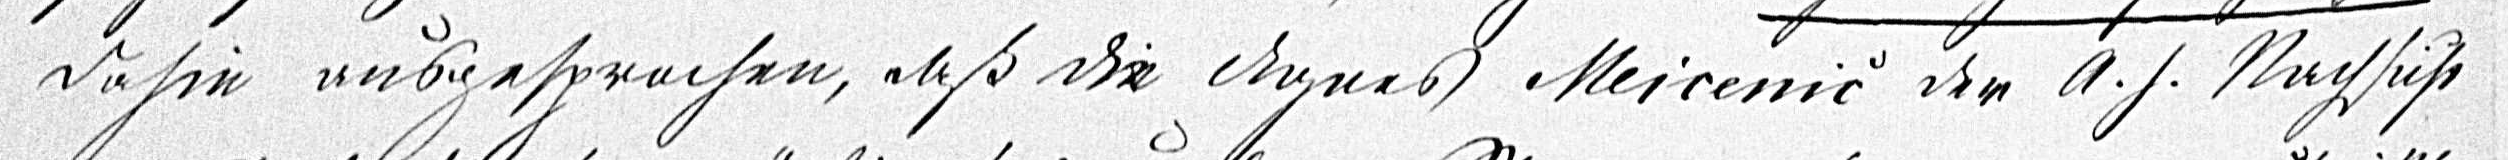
dahin ausgesprochen, daß die Agnes Meicenič der A. h. Nachsicht
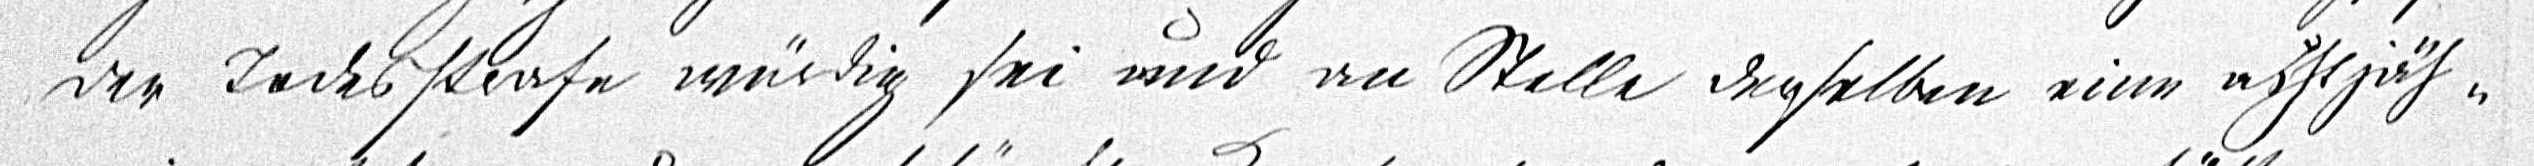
der Todesstrafe würdig sei und an Stelle derselben eine achtjäh¬
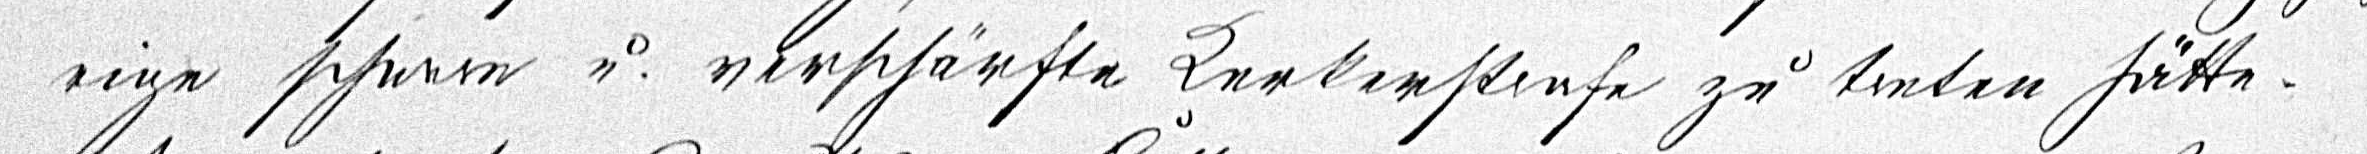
rige schwere u verschärfte Kerkerstrafe zu treten hätte.
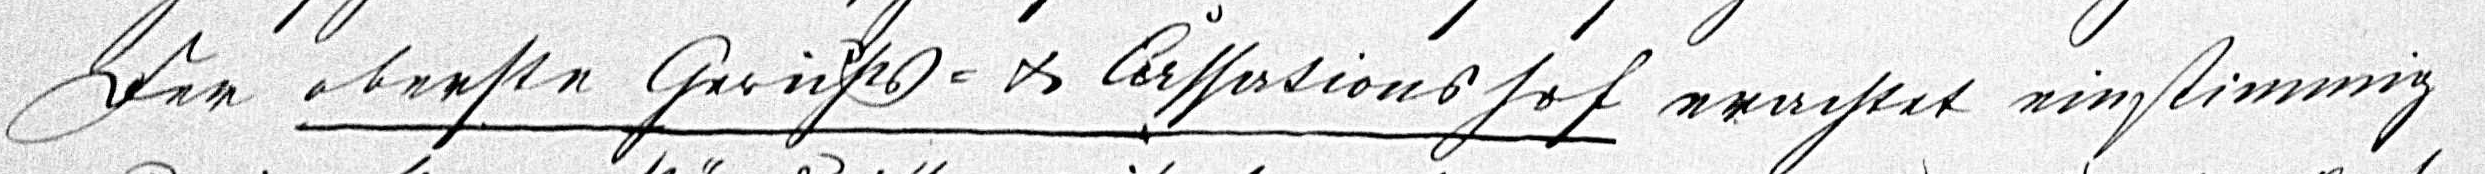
Der oberste Gerichts- und Cassationshof erachtet einstimmig
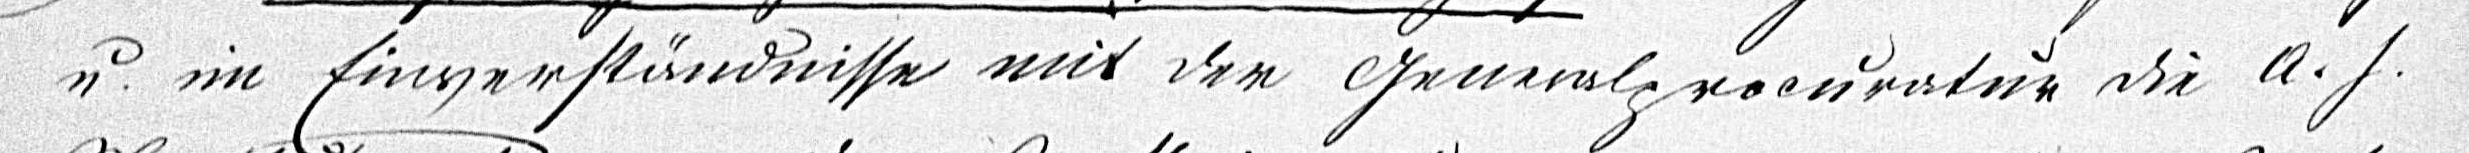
u. im Einverständnisse mit der Generalprokuratur die A.h.
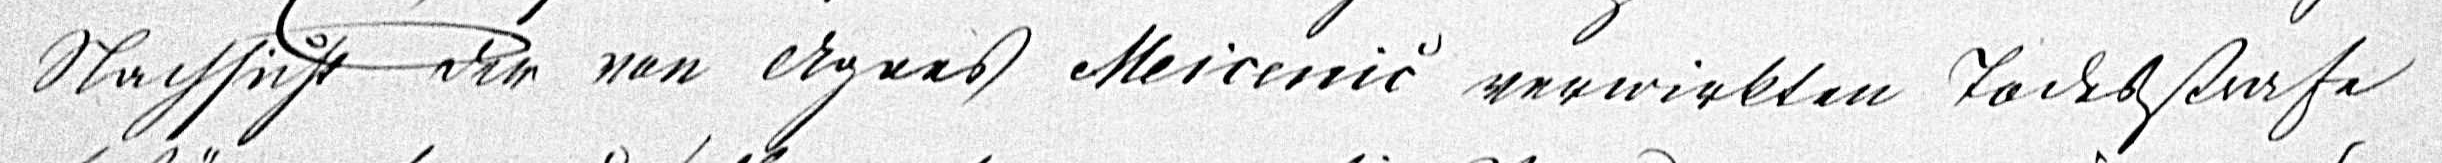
Nachsicht der von Agnes Meicenič verwirkten todesstrafe
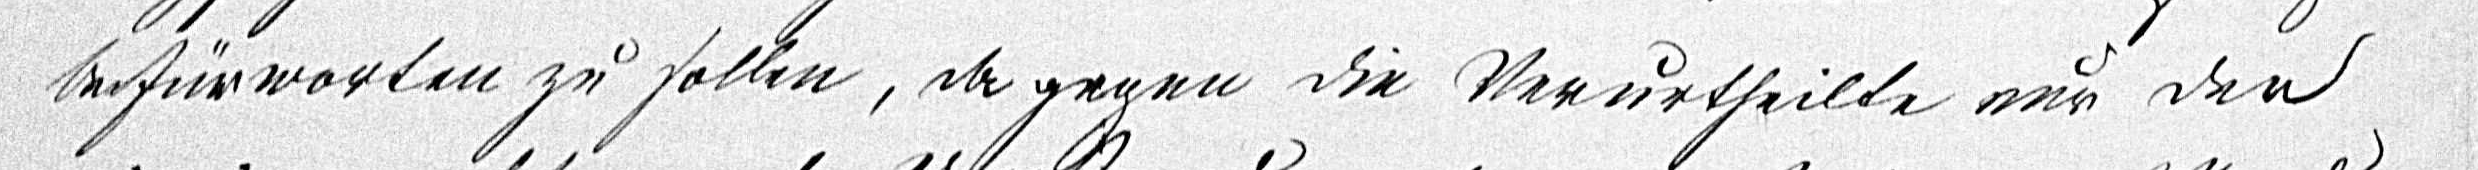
befürworten zu sollen, da gegen die Verurtheilte nur den
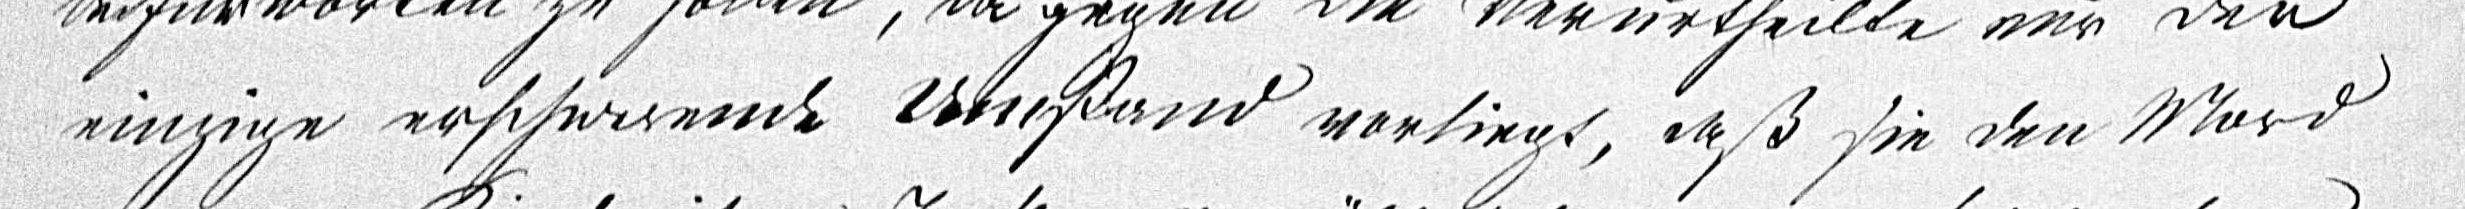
einzige erschwerende Umstand vorliegt, daß sie den Mord
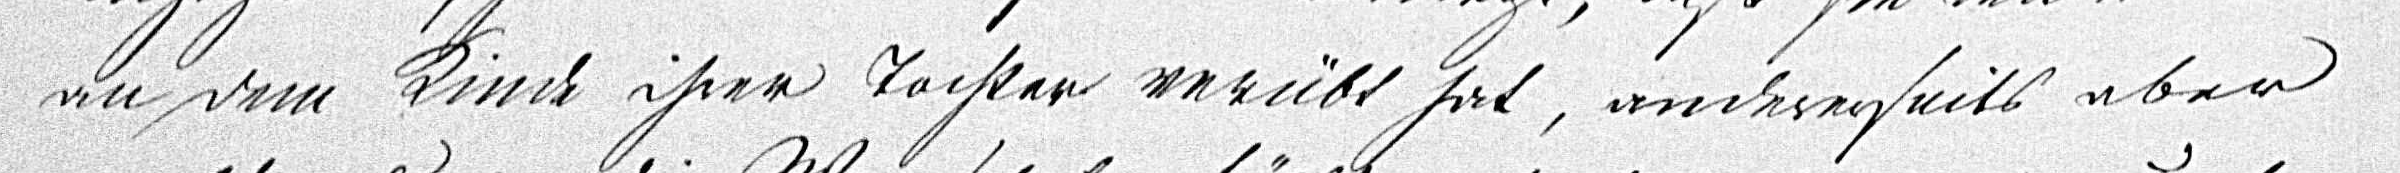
an dem Kind ihrer Tochter verübt hat, andererseits aber
